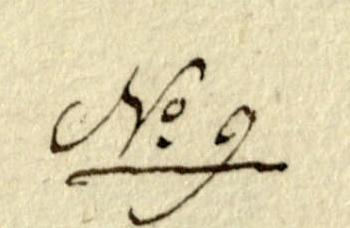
Nº 9
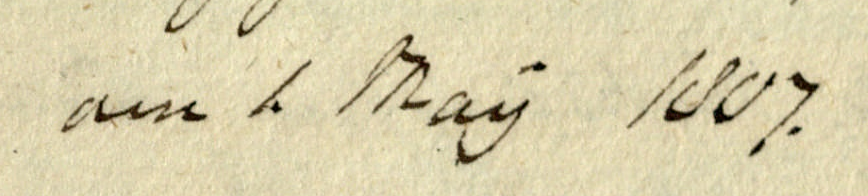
am 1. Maÿ 1807.
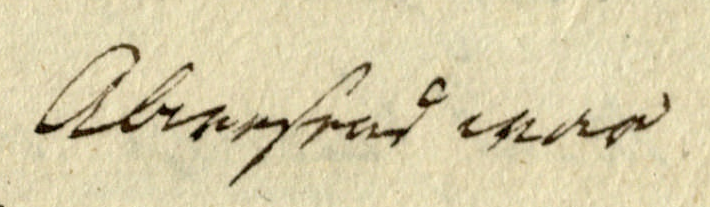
Abwesend war
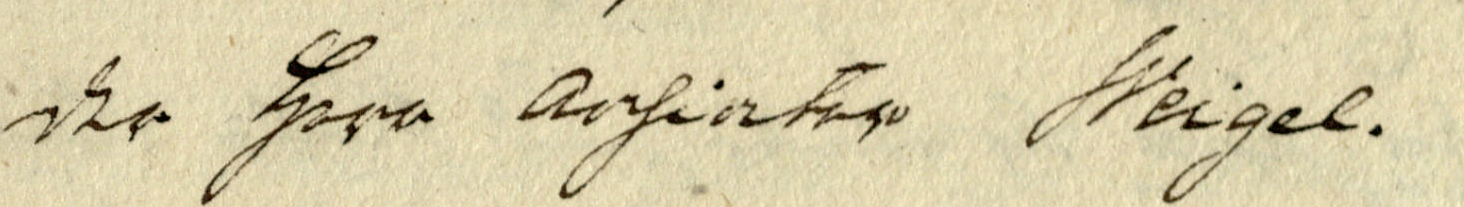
der Herr Archiater Weigel.
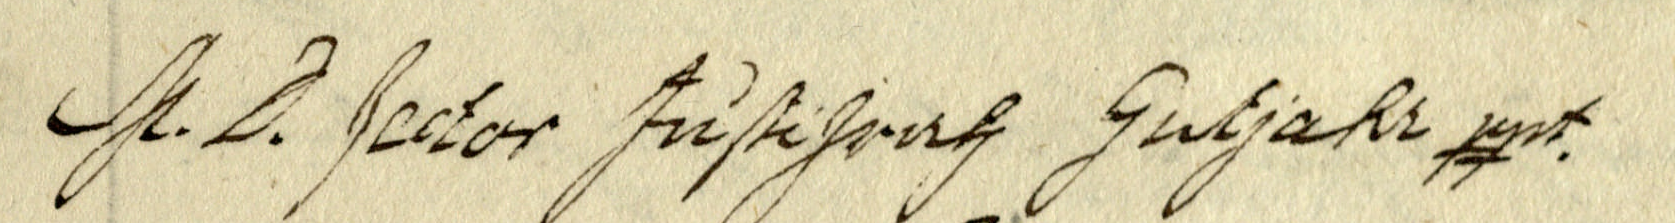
M. D. Rector Justizrath Gutjahr ppt.
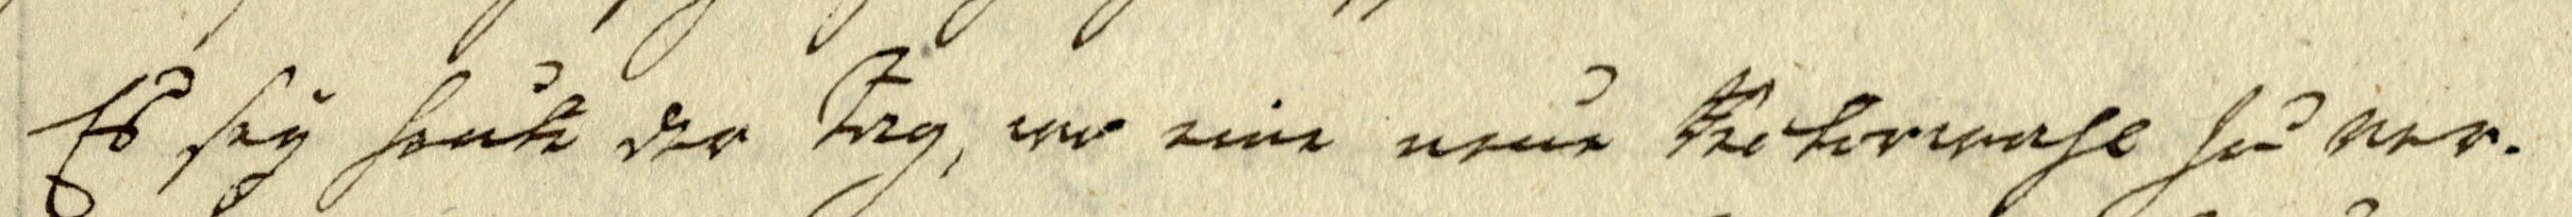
Es seÿ heute der Tag, wo eine neue Rectorwahl zu ver¬
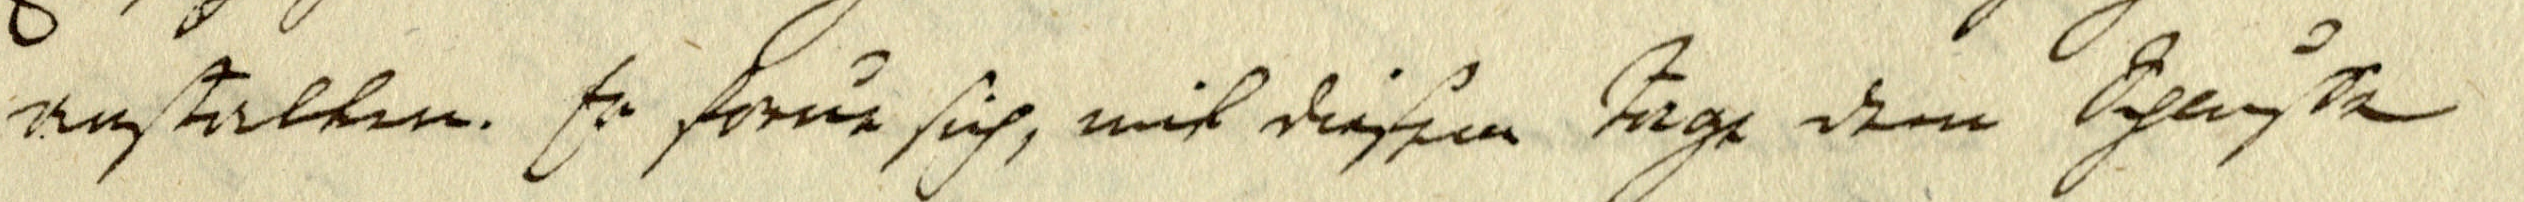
anstalten. Er freue sich, mit diesem Tage dem Schlusse
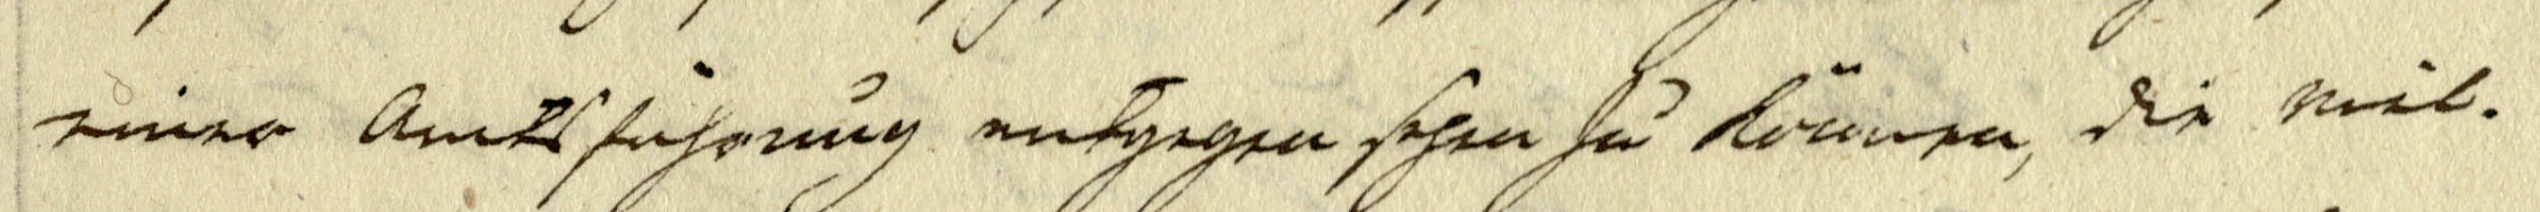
einer Amtsführung entgegen sehen zu können, die viel¬
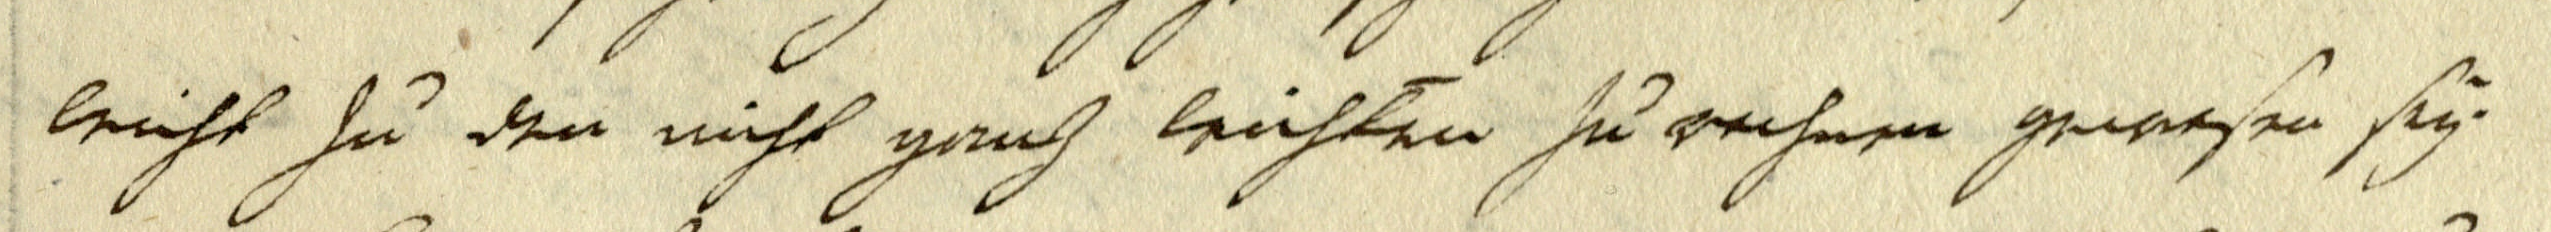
leicht zu den nicht ganz leichten zu rechenen gewesen seÿ.
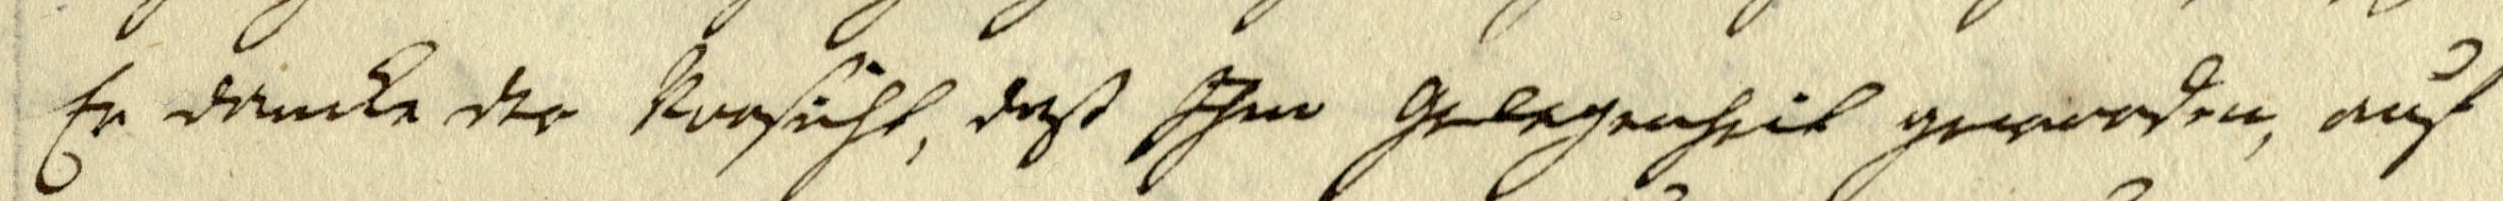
Er dancke der Vorsicht, daß Ihm Gelegenheit geworden, auf
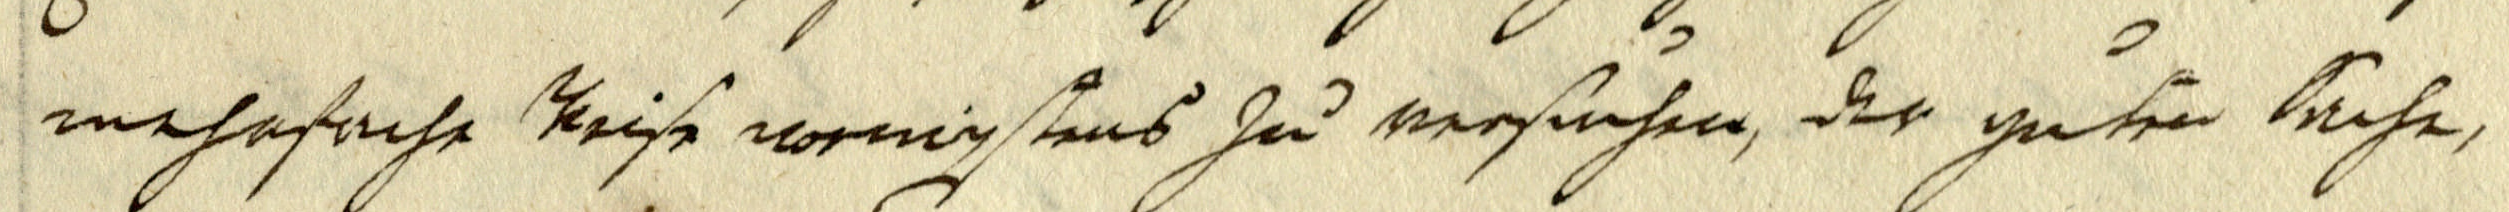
mehrfache Weise wenigstens zu versuchen, der guten Sache,
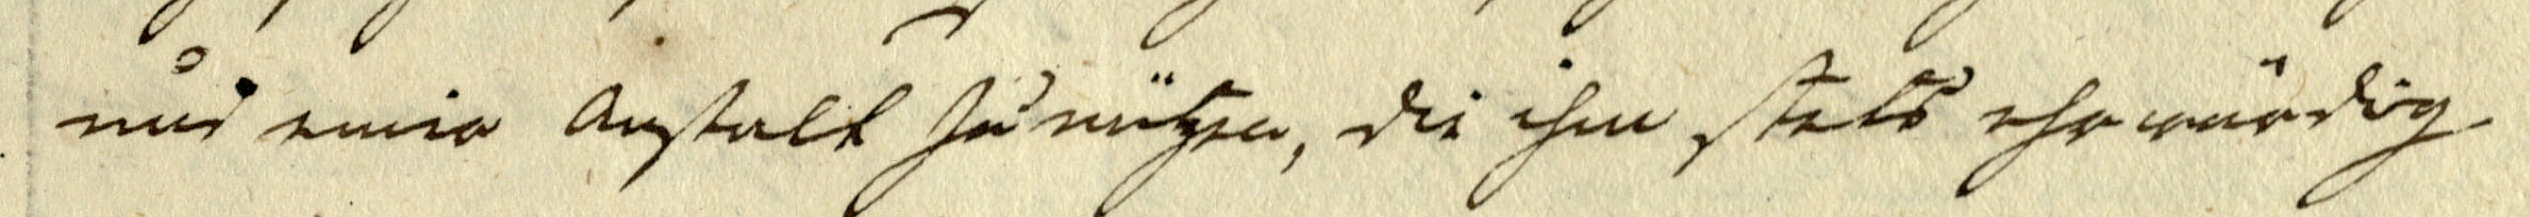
und einer Anstalt zu nützen, die ihm stets ehrwürdig
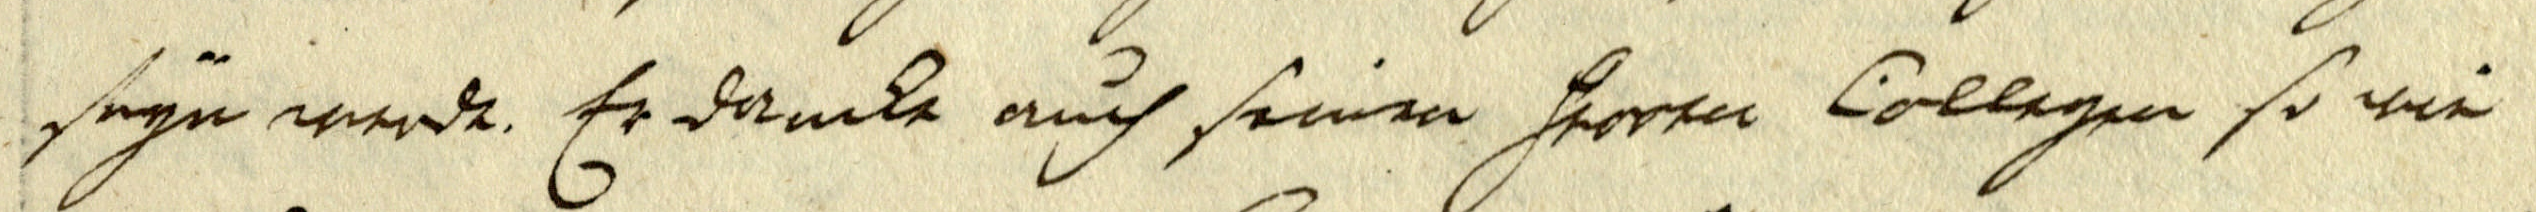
seÿn werde. Er dancke auch seinen herren Collegen so wie
